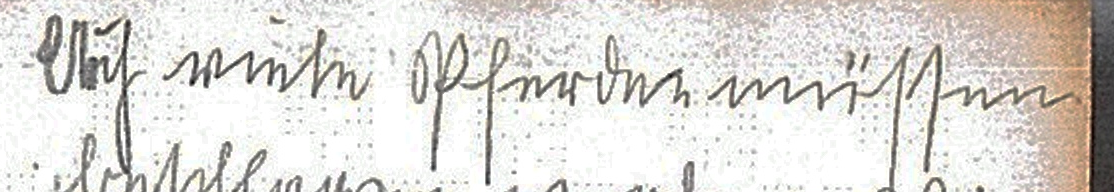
Auch viele Pferden müssen
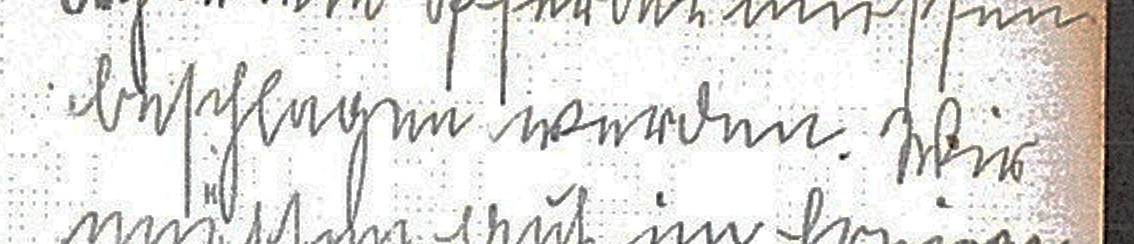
beschlagen werden. Wir
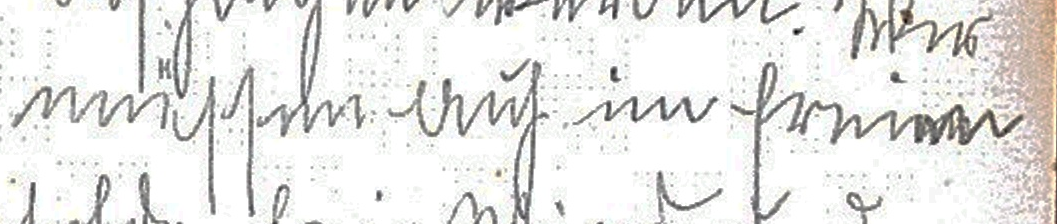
müssen auch im freien
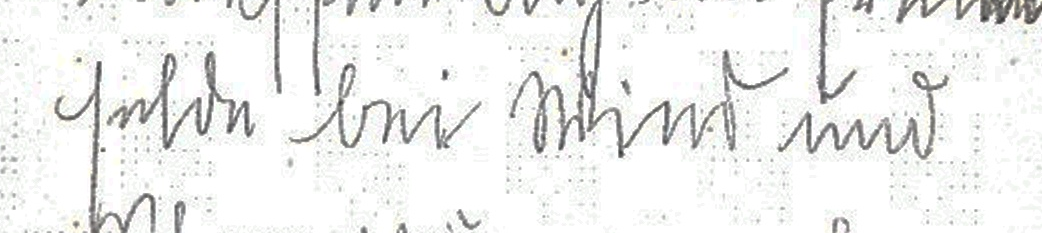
Felde bei Wind und
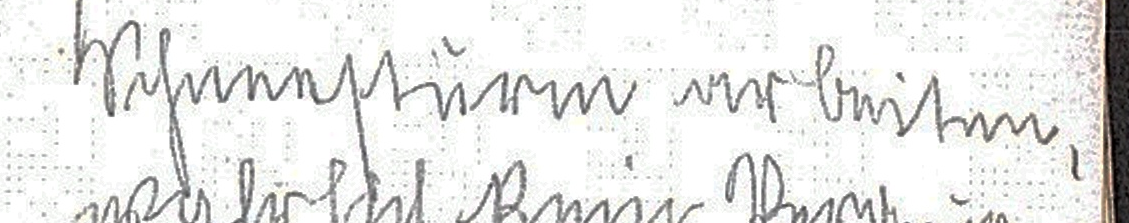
Schneesturm arbeiten,
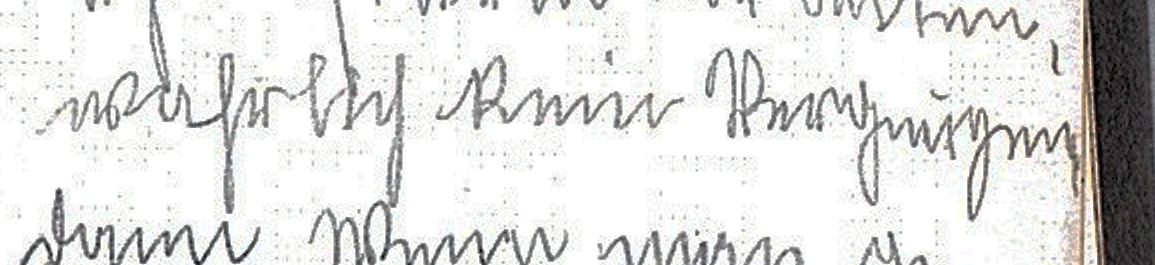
wahrlich kein Vergnügen,
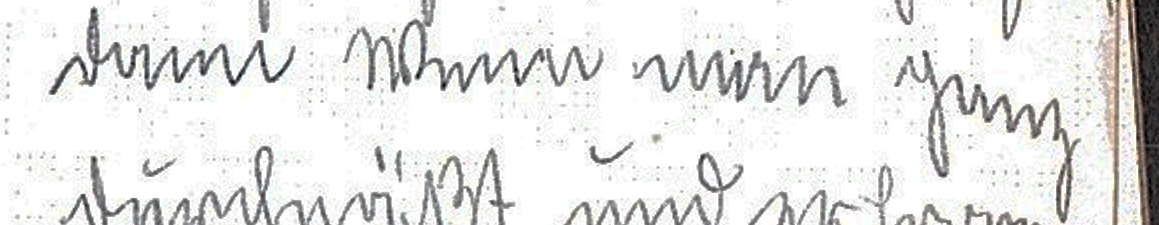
dann wen man ganz
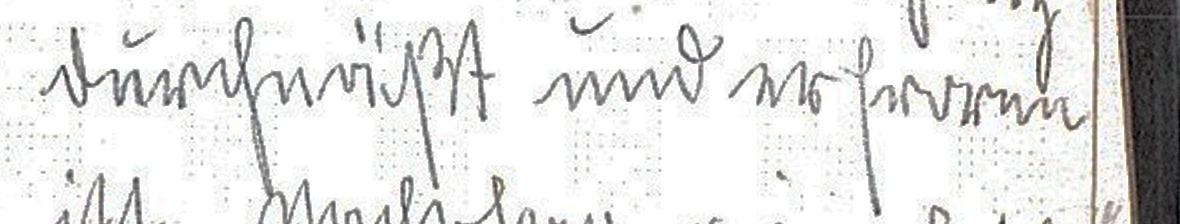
durchnäßt und erfroren
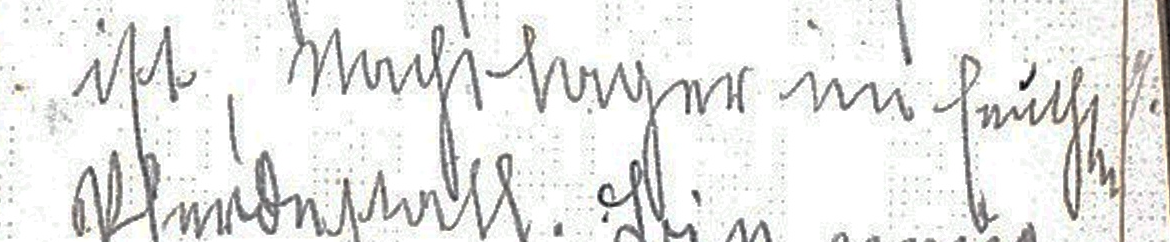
ist, Nachtlager im feuchten
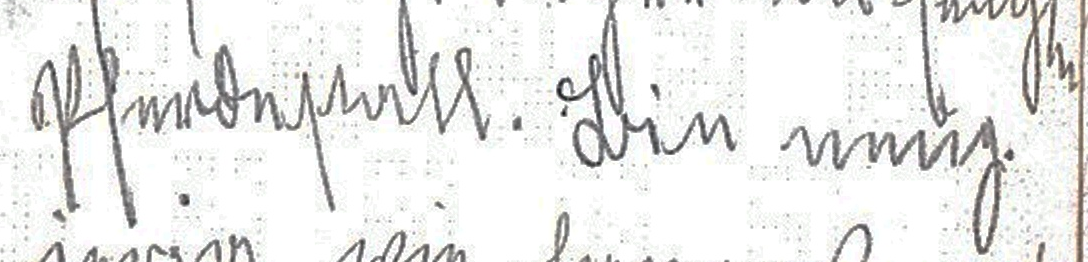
Pferdestall. Bin neug
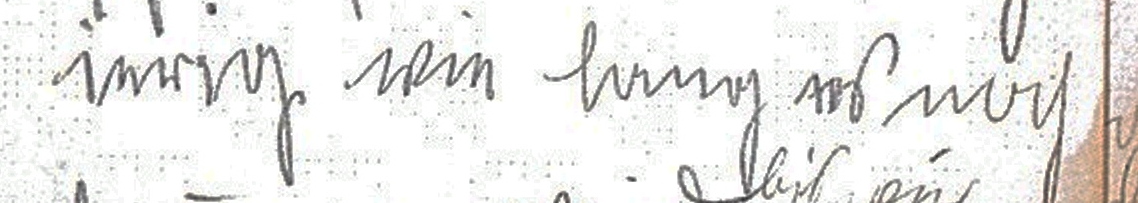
ierig wie lange es noch
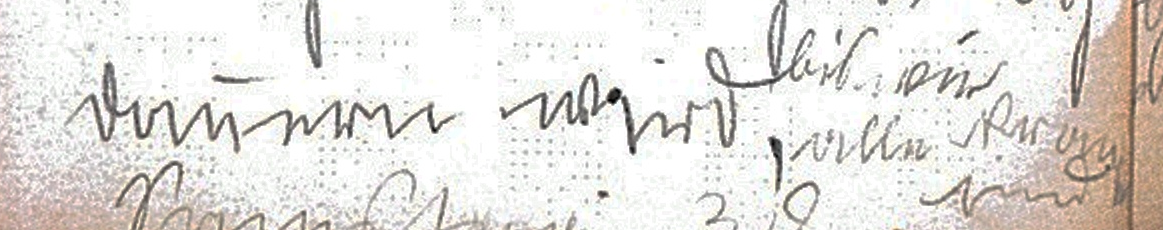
dauern wird bis wir alle krank sind.
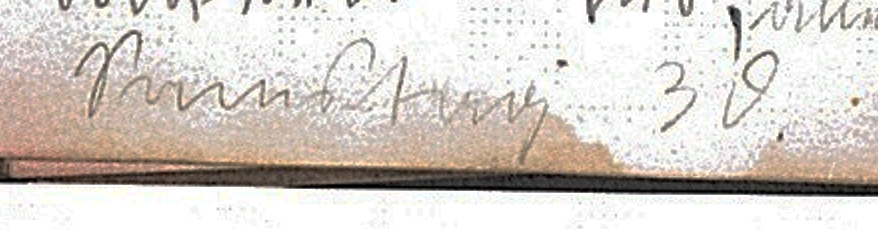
Samstag 30.
